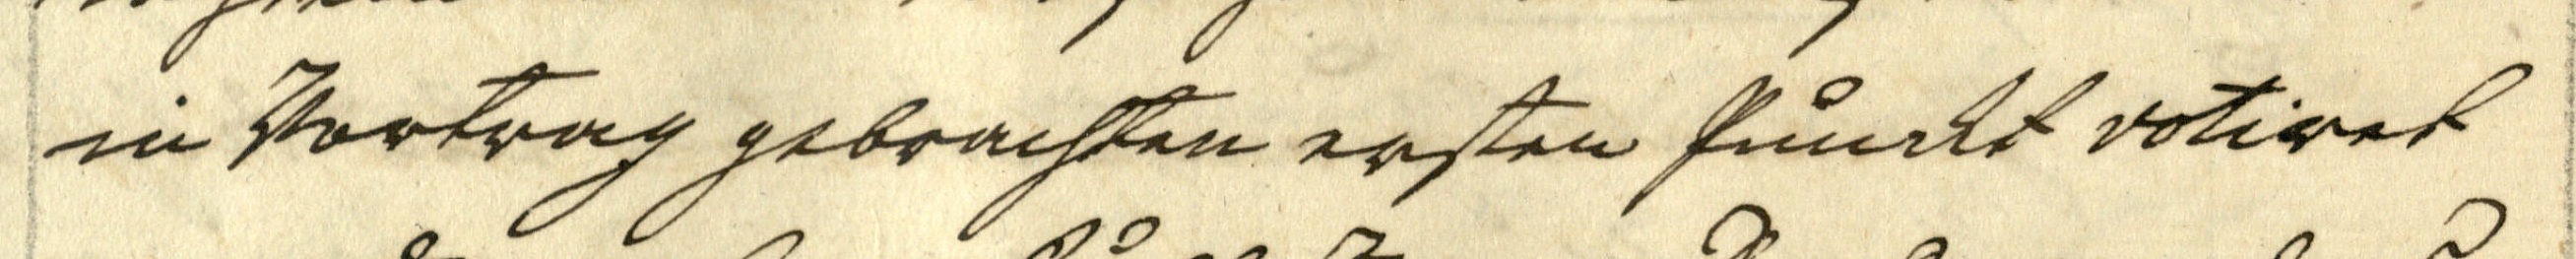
in Vortrag gebrauchten ersten Punckt votiret
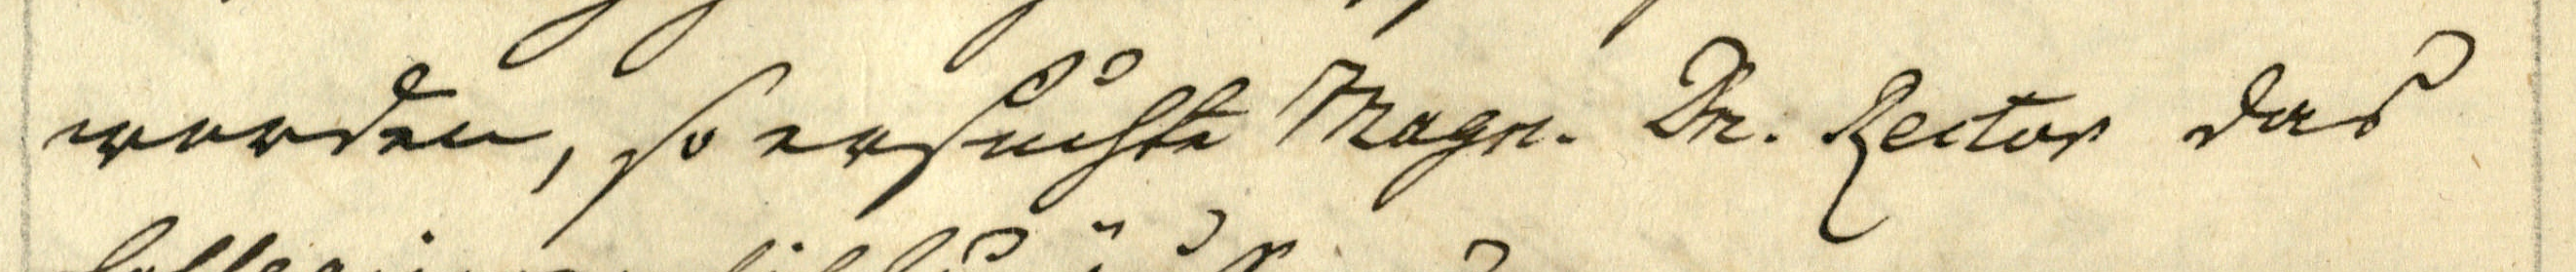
worden, so ersuchte Magn. Dn. Rector das
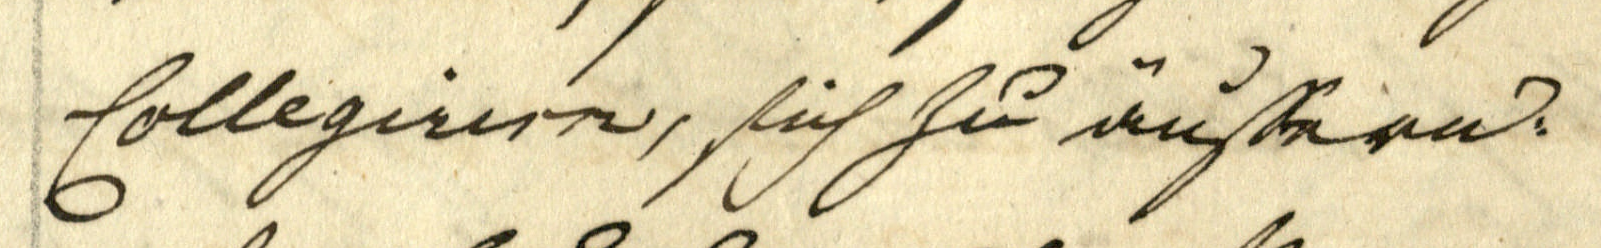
Collegium, sich zu äussern:
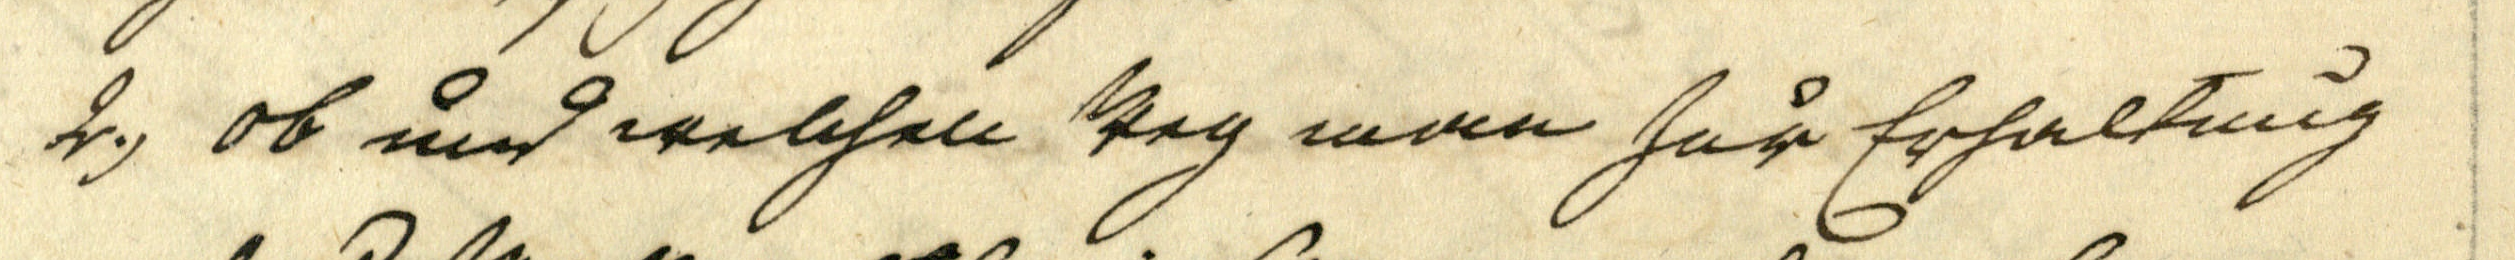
2., ob und welchem Weg man zur Erhaltung
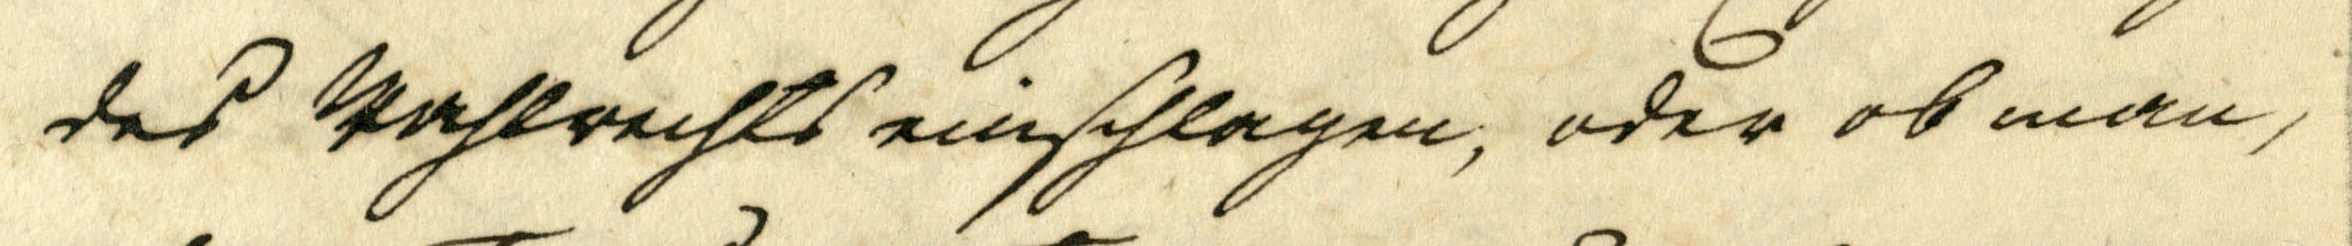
des Wahlrechts einschlagen, oder ob man,
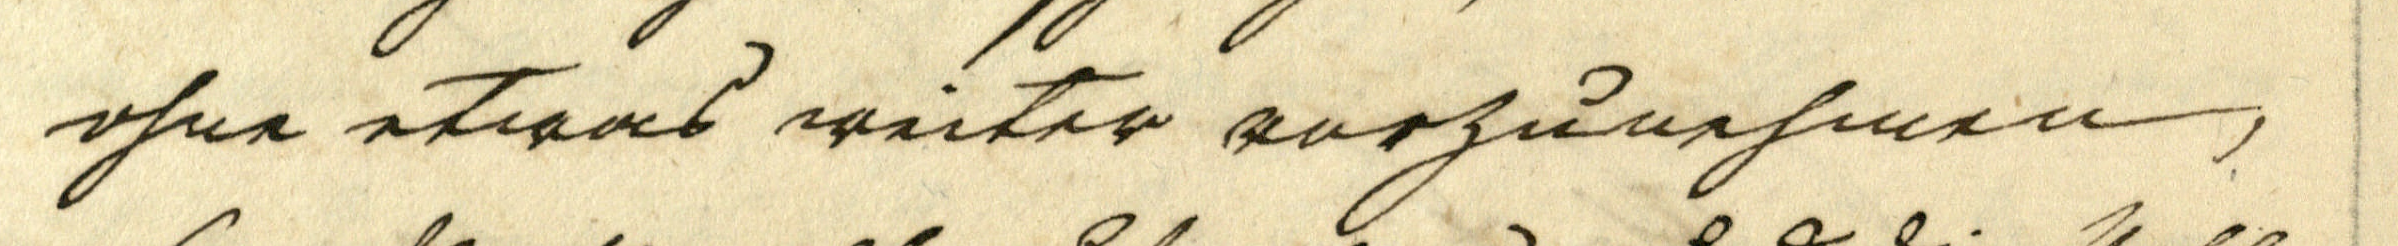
ohne etwas weiter vorzunehmen,
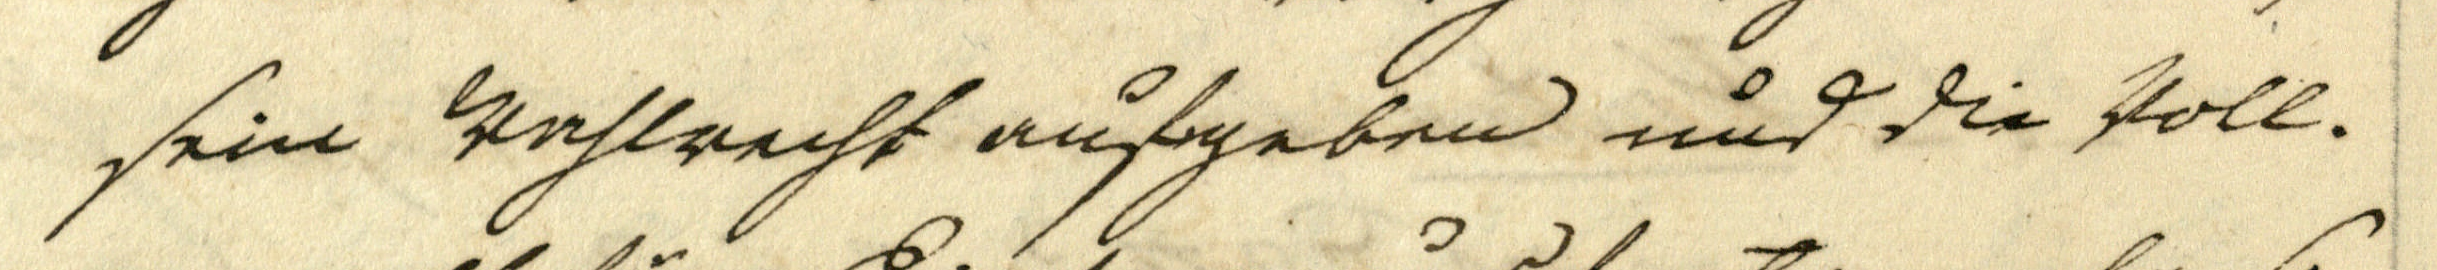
sein Wahlrecht aufgeben und die Voll¬
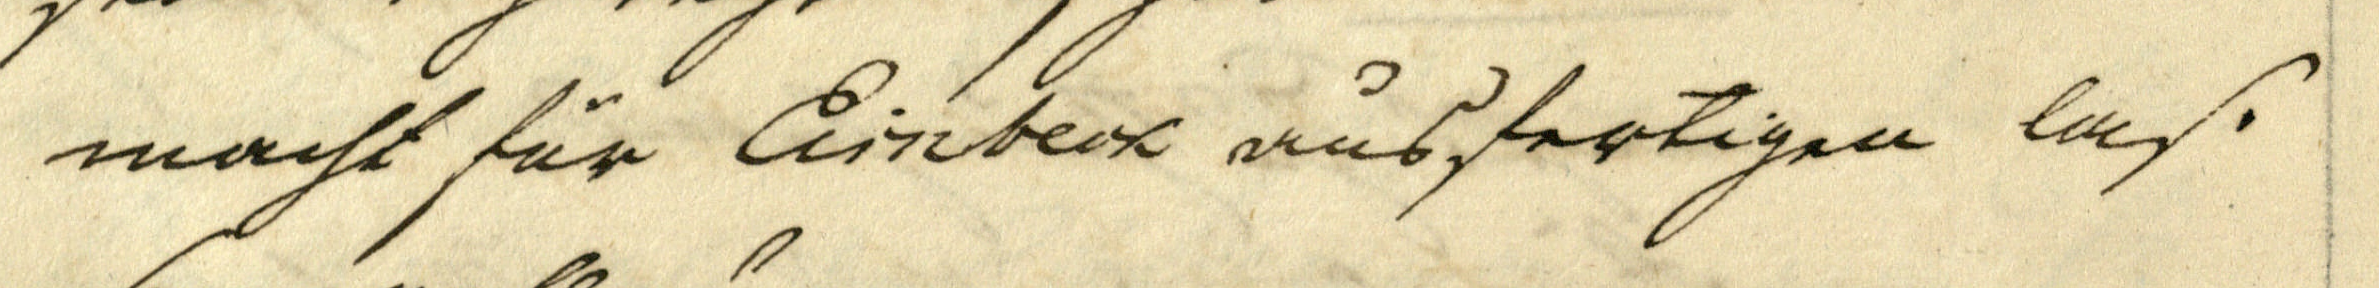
macht für Eimbeck ausfertigen las¬
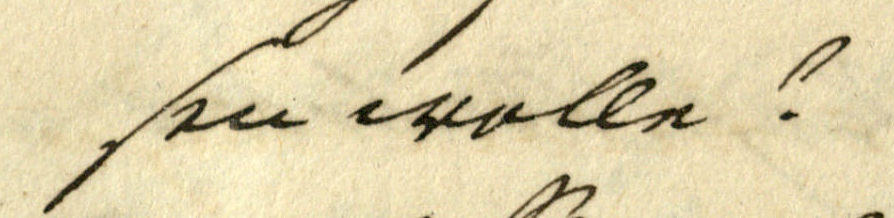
sen wolle?
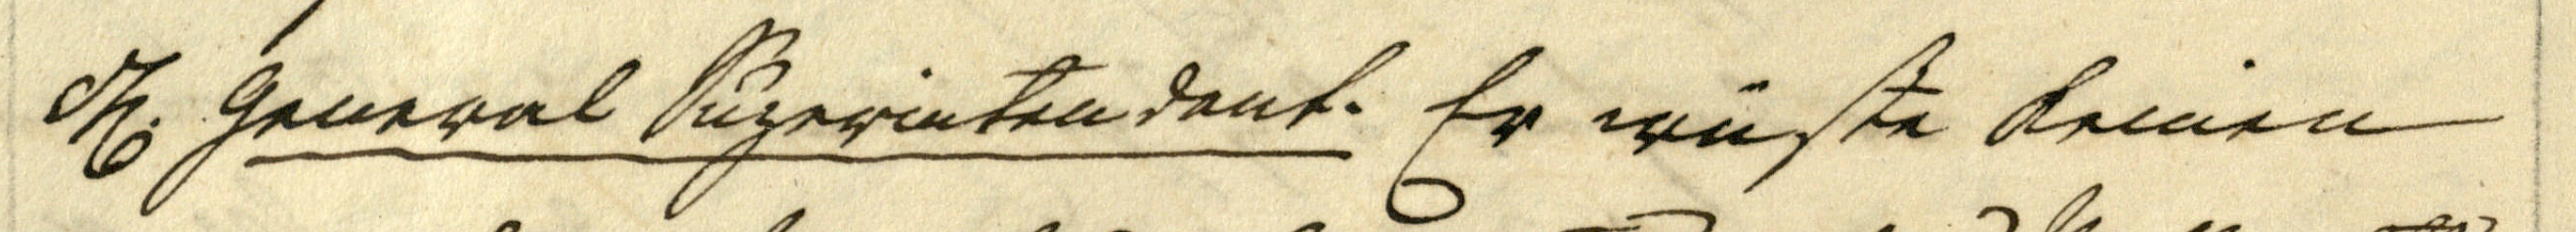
dh. General Superintendent. Er wüßte keinen
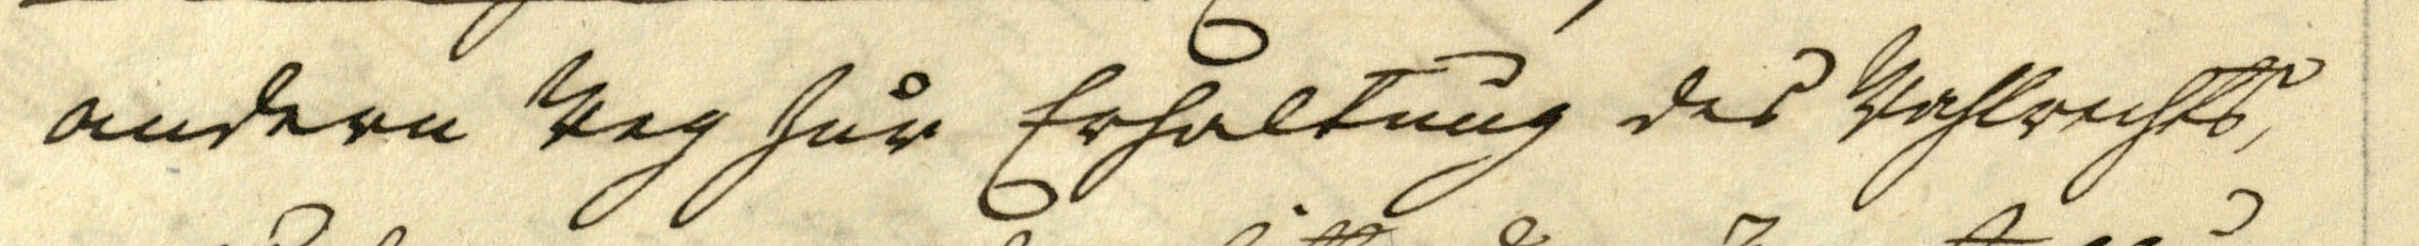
andern Weg zur Erhaltung des Wahlrechts,
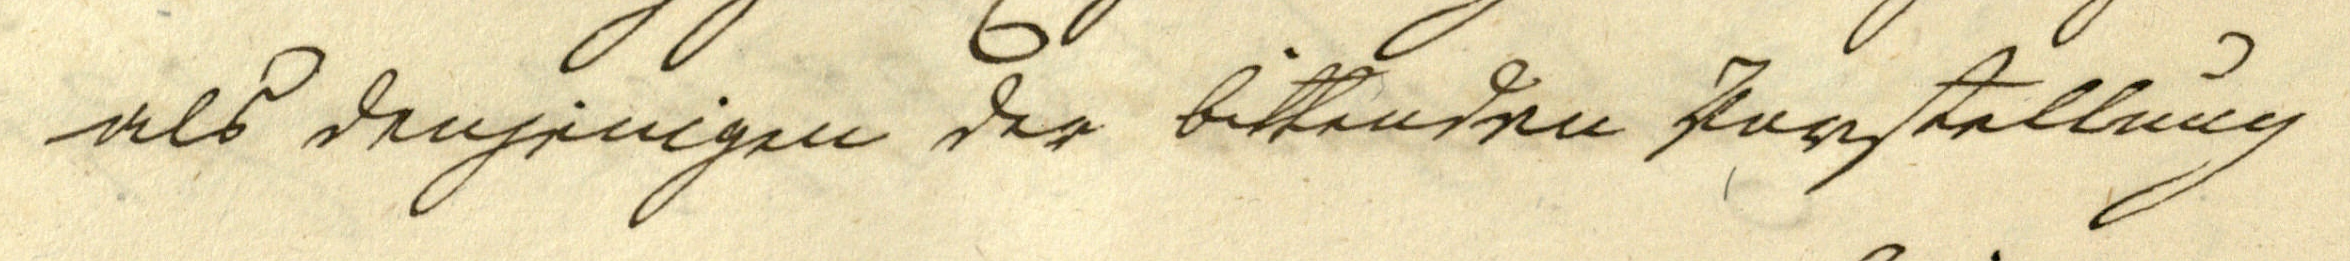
als denjenigen der bittenden Vorstellung
